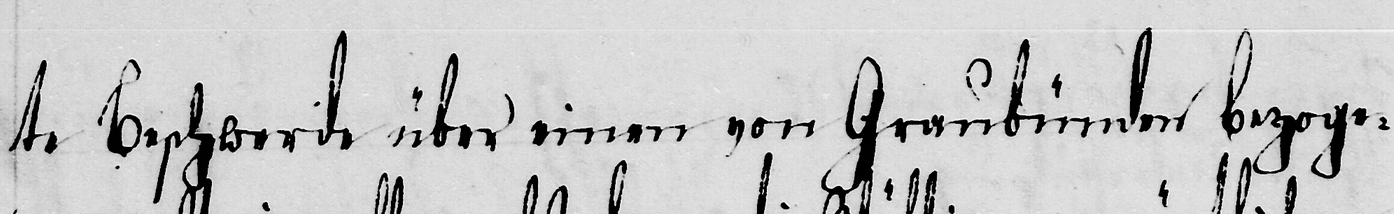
te Beschwerde über einen von Graubünden bezoge¬
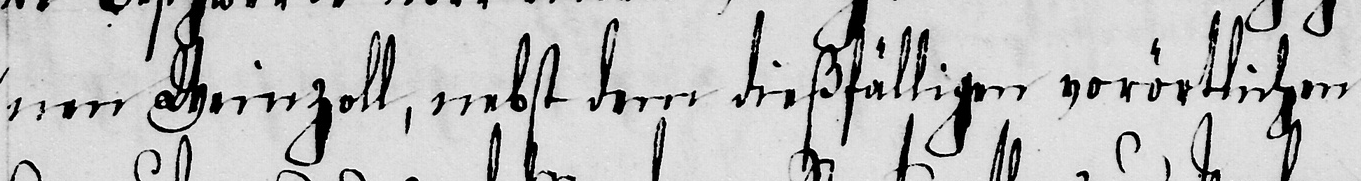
nen Weinzoll, nebst dem dießfälligen vorörtlichen
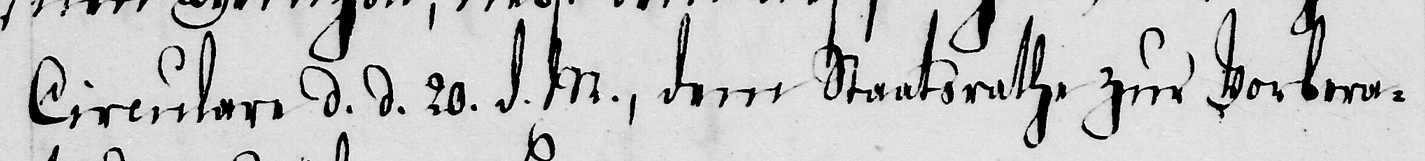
Circulare d.d. 20. d. M., dem Staatsrathe zur Vorbera¬
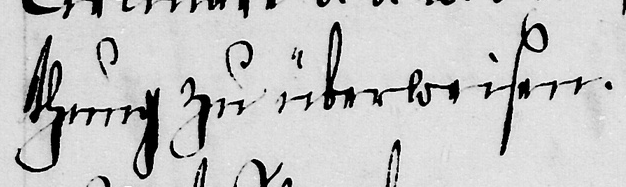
thung zu überweisen.
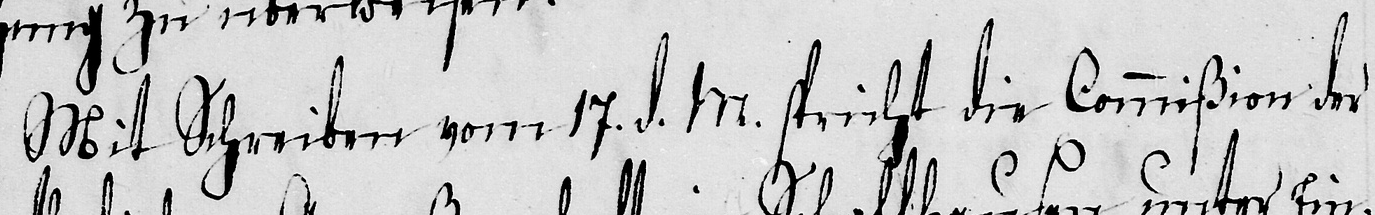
Mit Schreiben vom 17. d. M. spricht die Commißion der
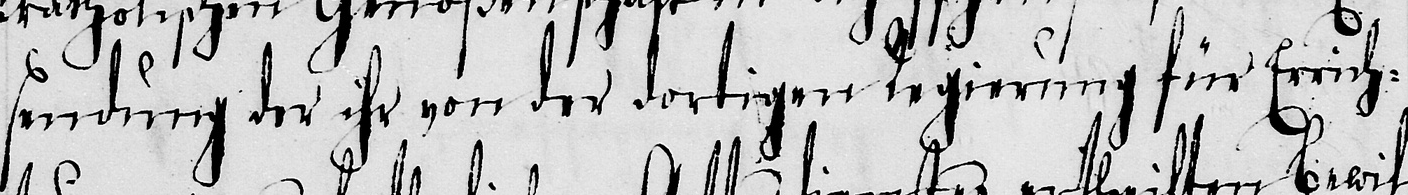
sendung der ihr von der dortigen Regierung für Errich¬
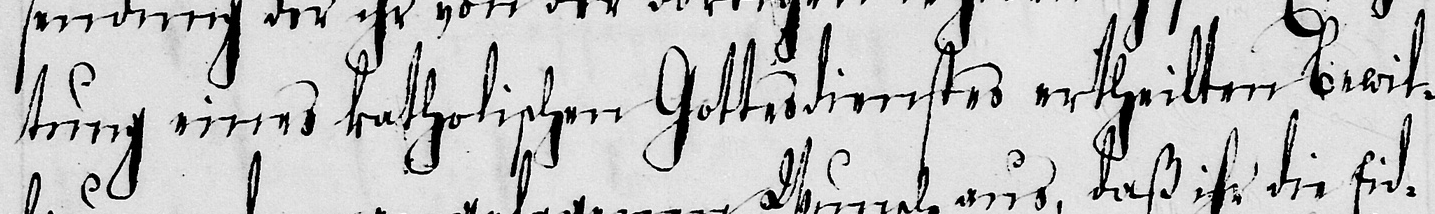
tung eines katholischen Gottesdienstes ertheilten Bewil¬
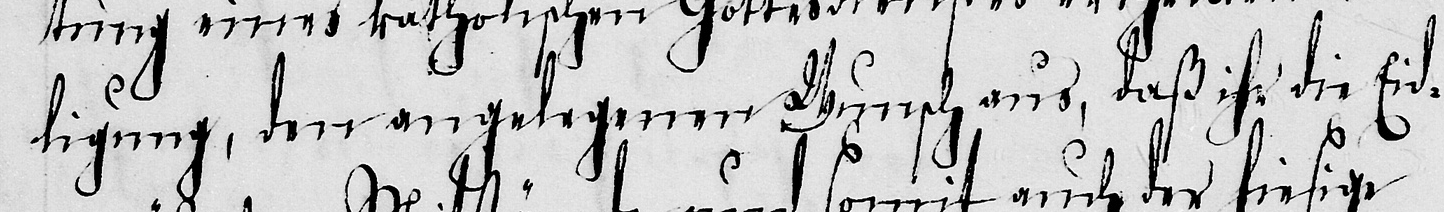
ligung, den angelegenen Wunsch aus, daß ihr die Eid¬
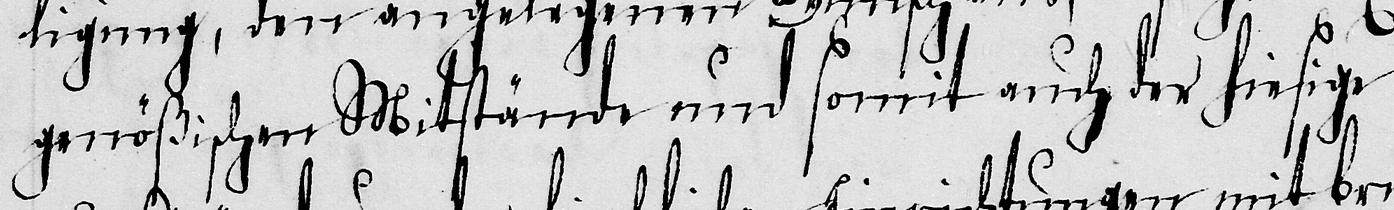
genößischen Mitstände und somit auch der hiesige
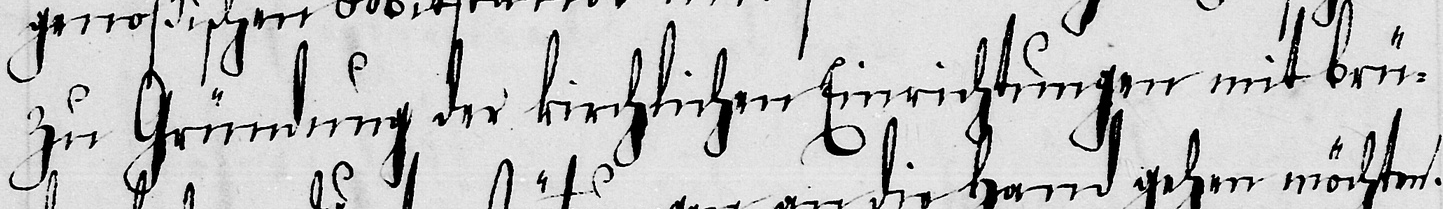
zu Gründung der kirchlichen Einrichtungen mit brü¬
